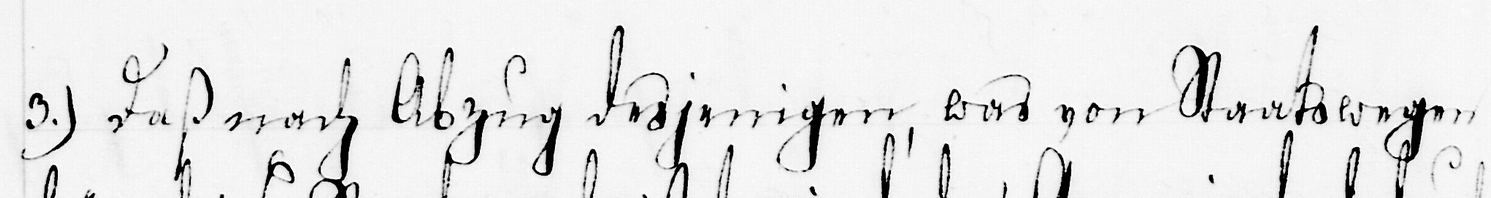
3.) Daß nach Abzug desjenigen, was von Staatswegen
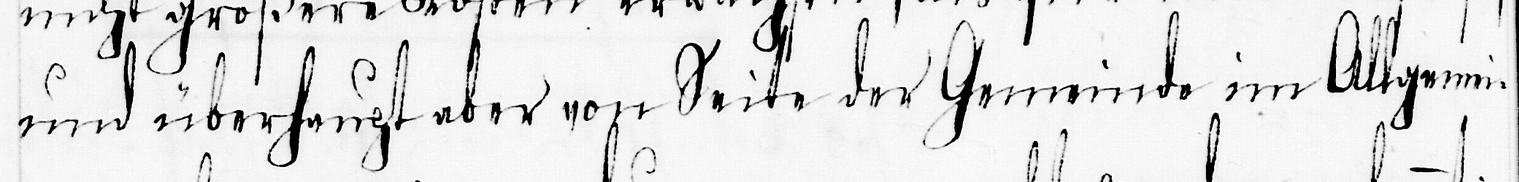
und überhaupt aber von Seite der Gemeinde im Allgemei¬
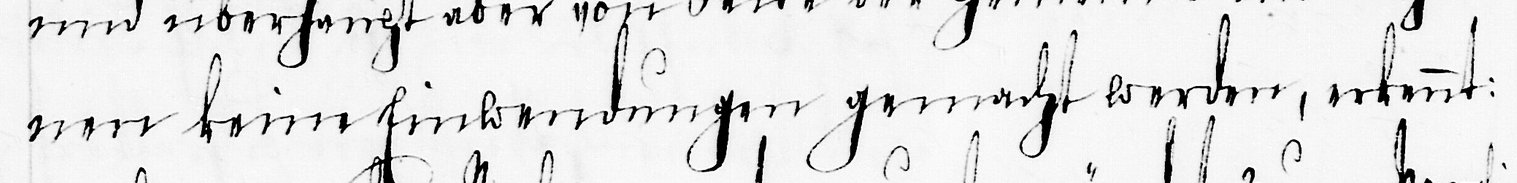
nen keine Einwendungen gemacht werden, erkennt:
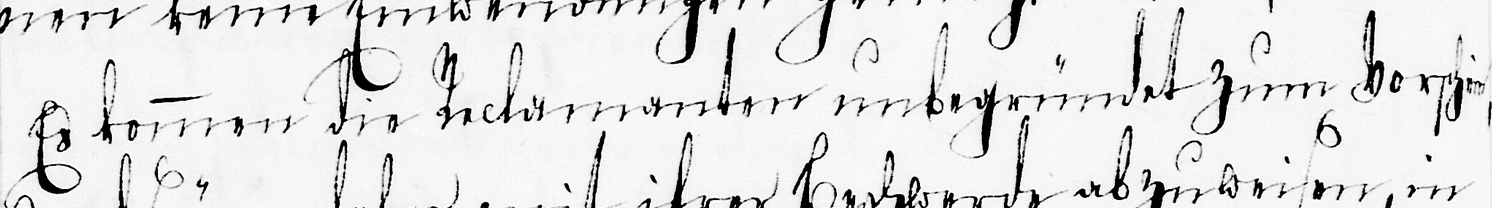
Es kommen die Reclamanten unbegründet zum Vorsch¬
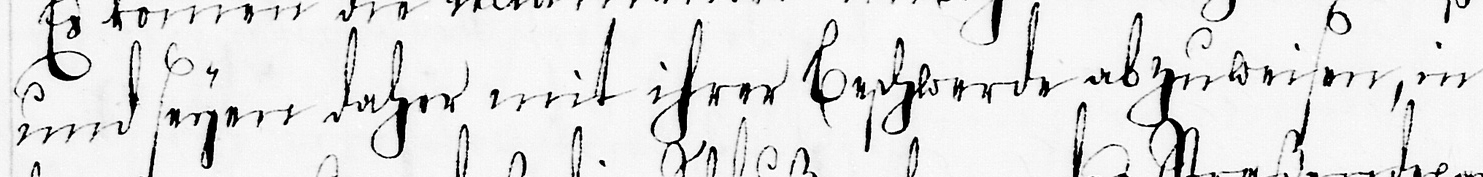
und seyen daher mit ihrer Beschwerde abzuweisen, in
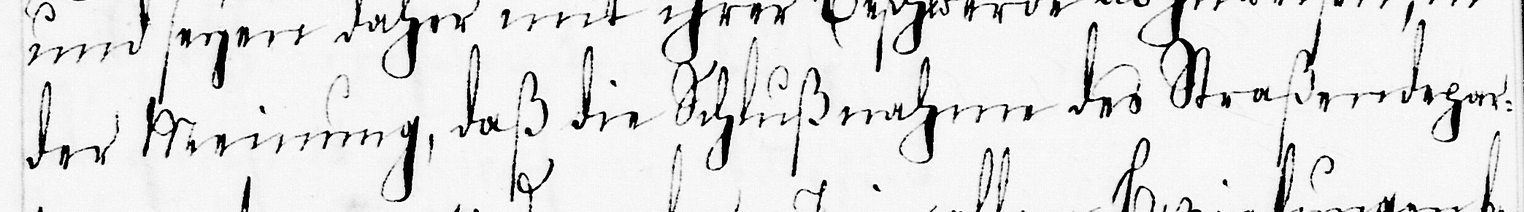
der Meinung, daß die Schlußnahme des Straßendepar¬
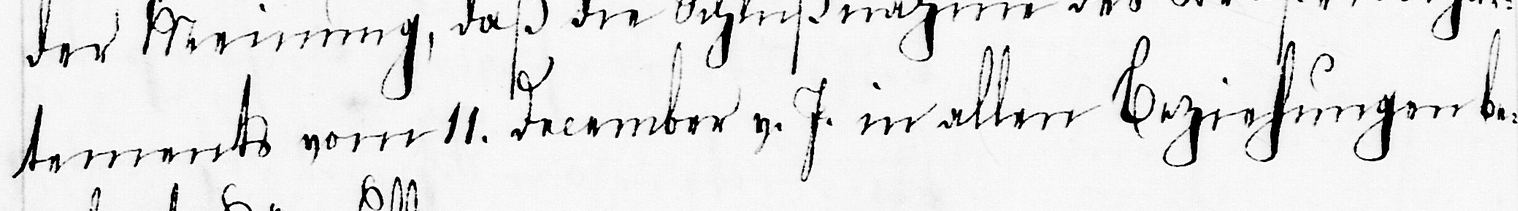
tements vom 11. December v. J. in allen Beziehungen be¬
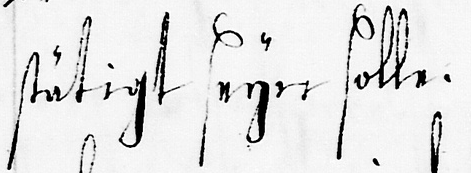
stätigt seyn solle.
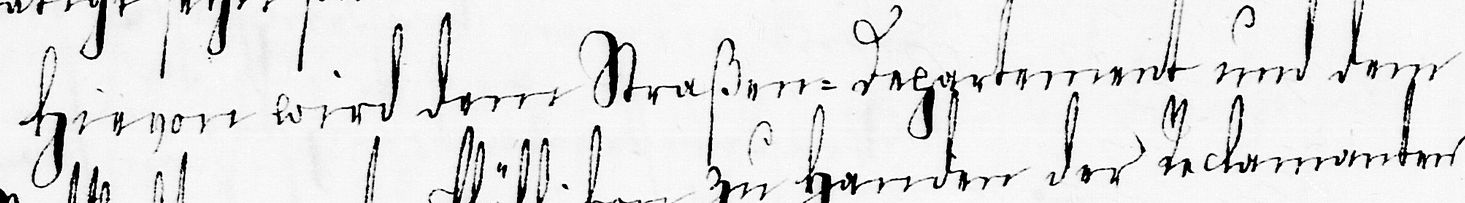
Hievon wird dem Straßen-Departement und dem
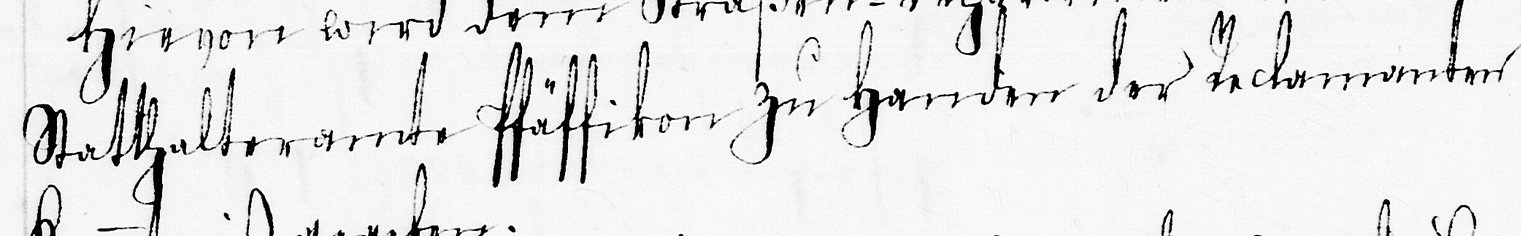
Statthalteramte Pfäffikon zu Handen der Reclamanten
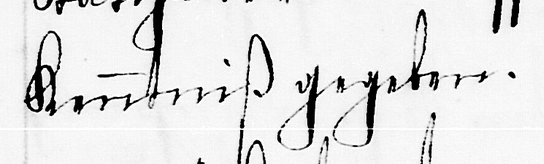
Kenntniß gegeben.
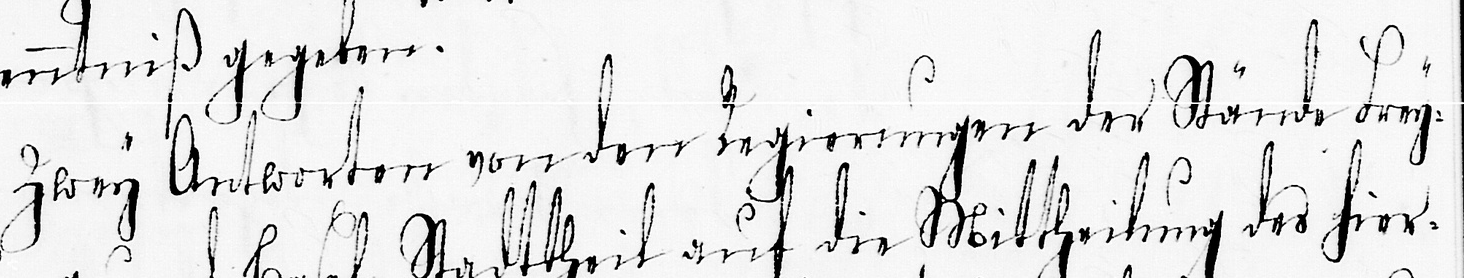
Zwey Antworten von den Regierungen der Stände Frey¬
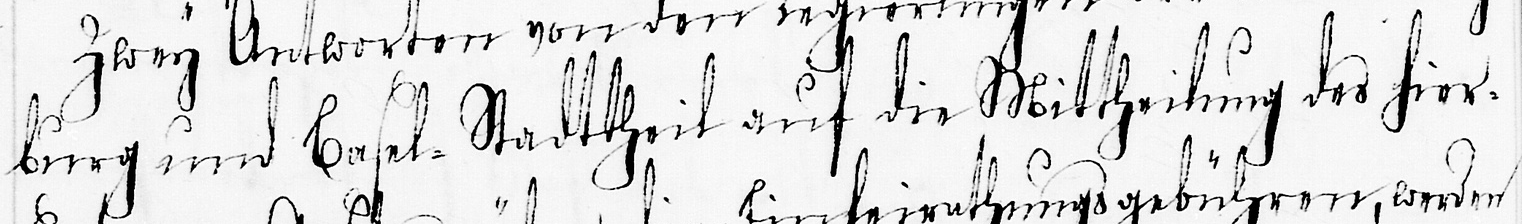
burg und Basel-Stadttheil auf die Mittheilung des hier¬
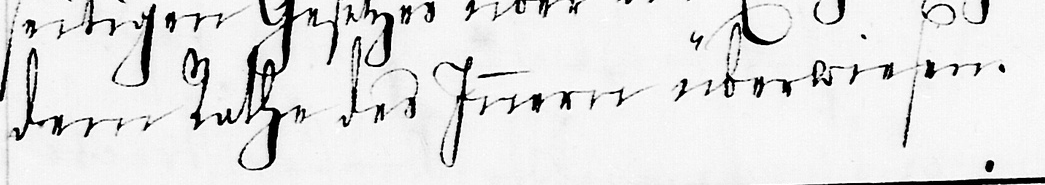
dem Rathe des Innern überwiesen.
